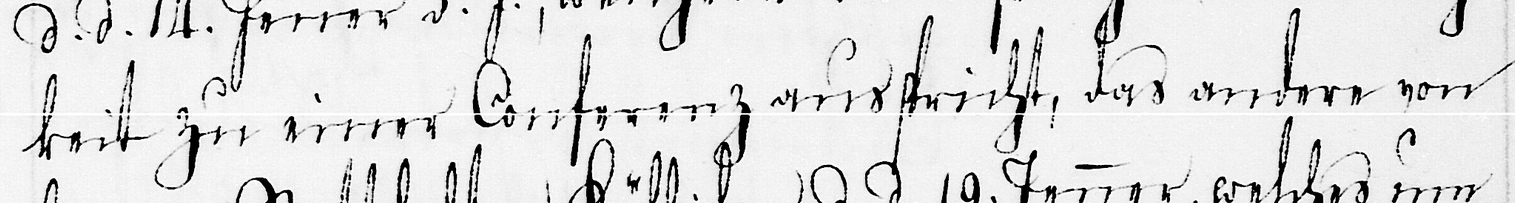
keit zu einer Conferenz ausspricht, das andere von
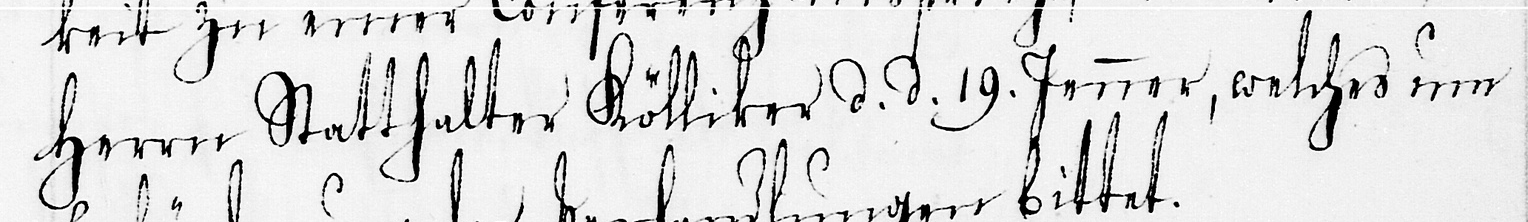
Herrn Statthalter Kölliker d. d. 19. Jenner, welches um
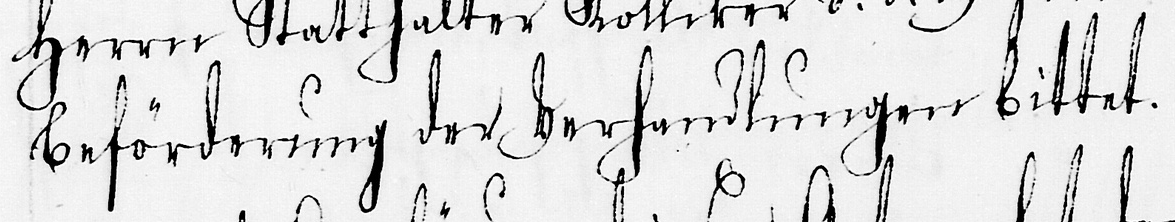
Beförderung der Verhandlungen bittet.
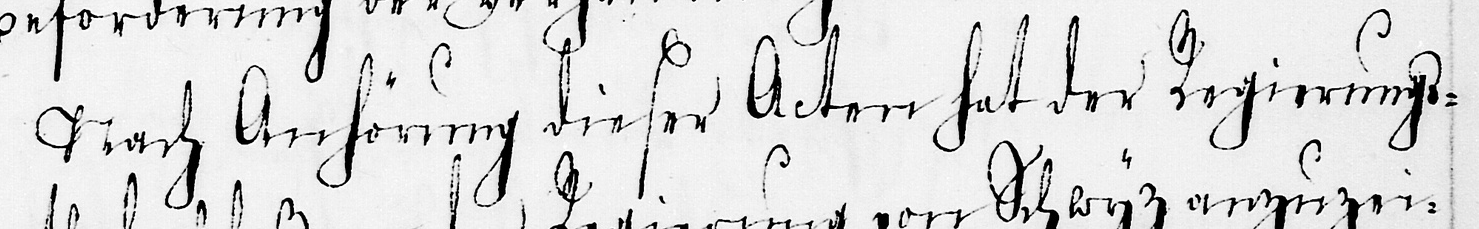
Nach Anhörung dieser Acten hat der Regierungs¬
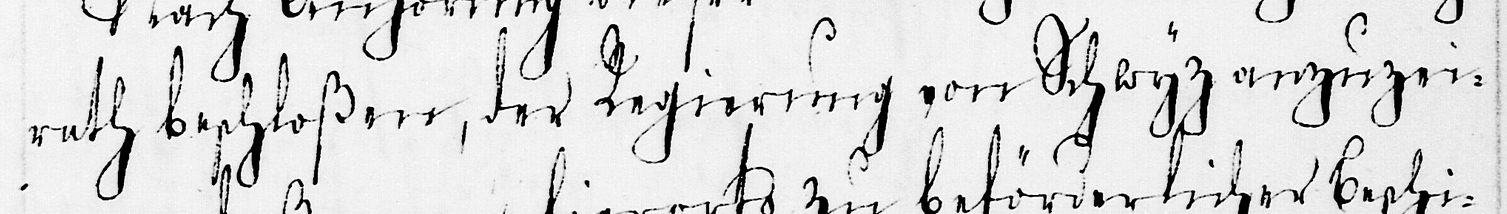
rath beschloßen, der Regierung von Schwyz anzuzei¬
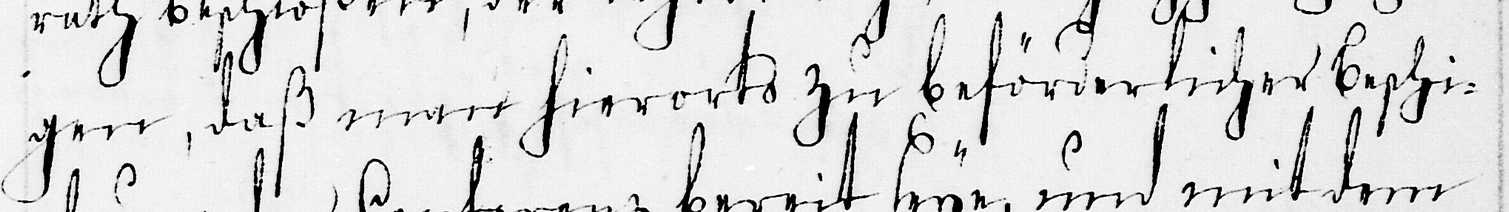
gen, daß man hierorts zu beförderlicher Beschi¬
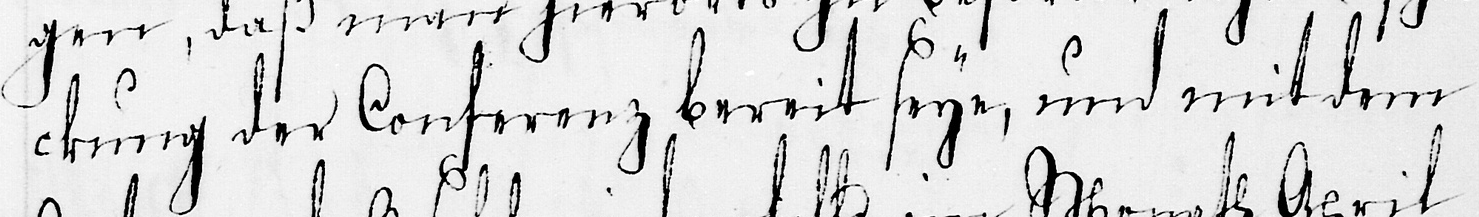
ckung der Conferenz bereit seye, und mit dem
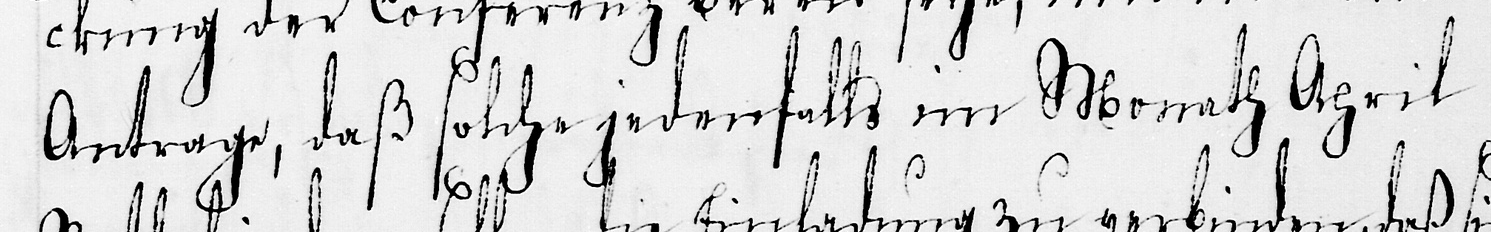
Antrage, daß solche jedenfalls im Monath April
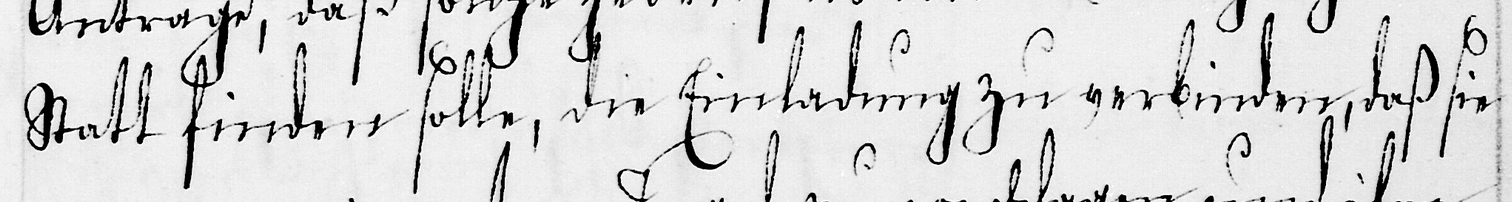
Statt finden solle, die Einladung zu verbinden, daß sie
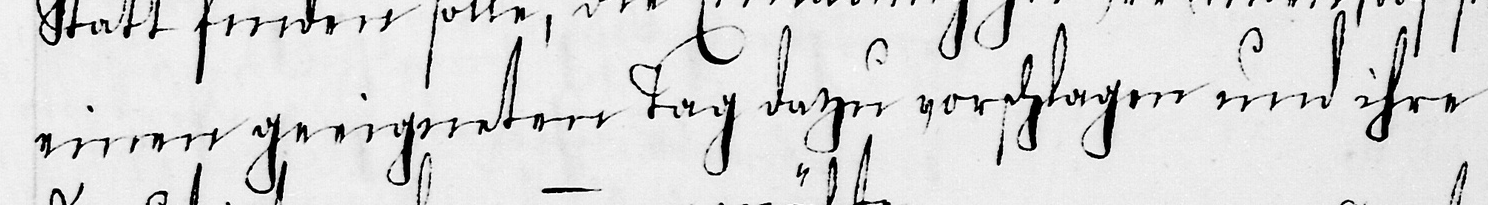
einen geeigneten Tag dazu vorschlagen und ihre
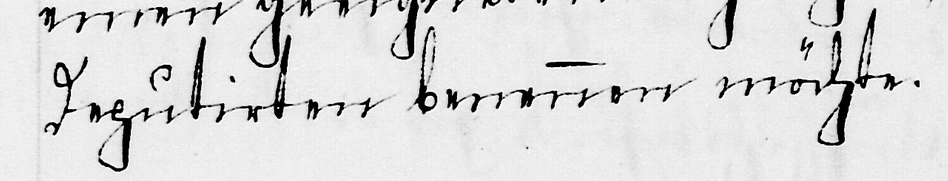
Deputirten benennen möchte.
